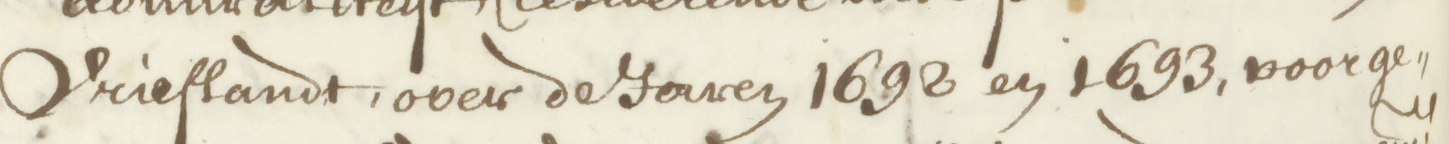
Vrieslandt, over de Jaren 1692 en 1693, voorge„
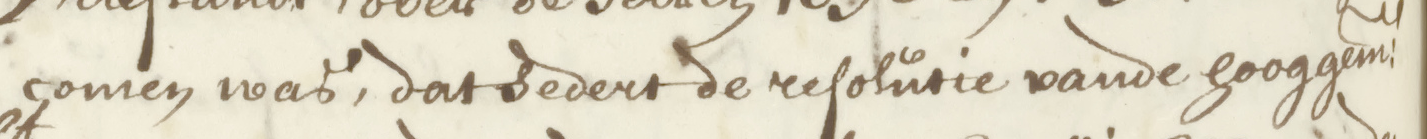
comen was, dat sedert de resolutie vande hooggem
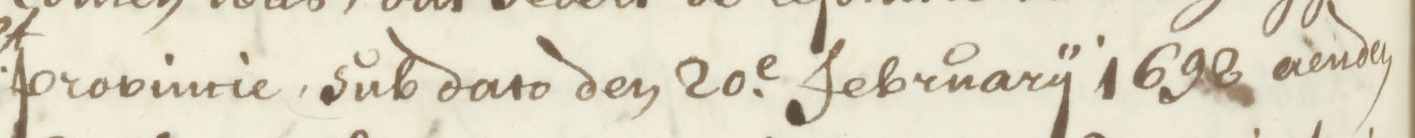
provincie, sub dato den 20e. februarij 1692 aenden
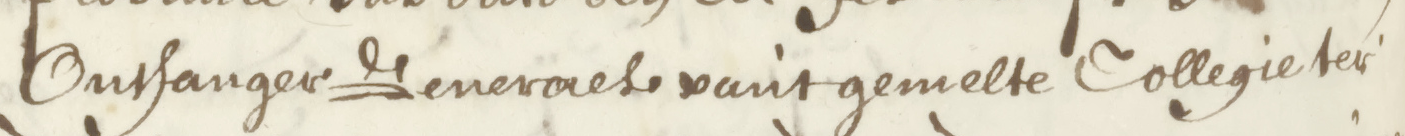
Ontfanger Generael van‛t gemelte Collegie ter
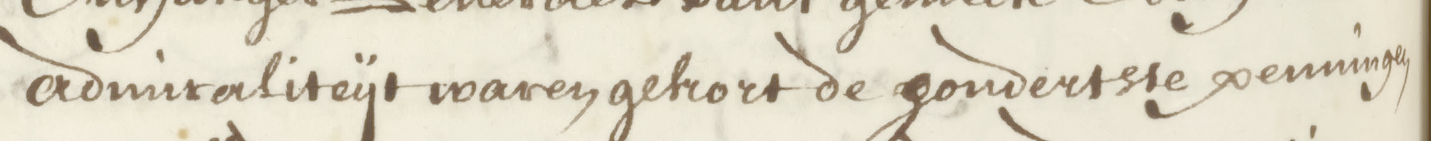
admiraliteijt waren gekort de hondertste penningen
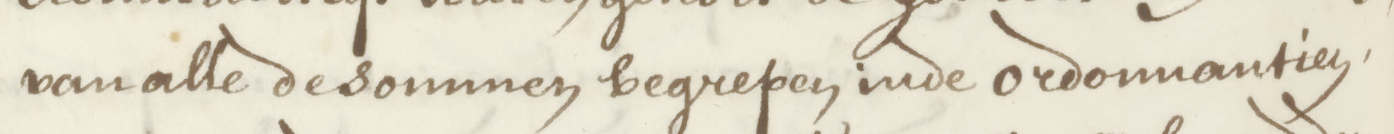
van alle de sommen begrepen inde ordonnantien
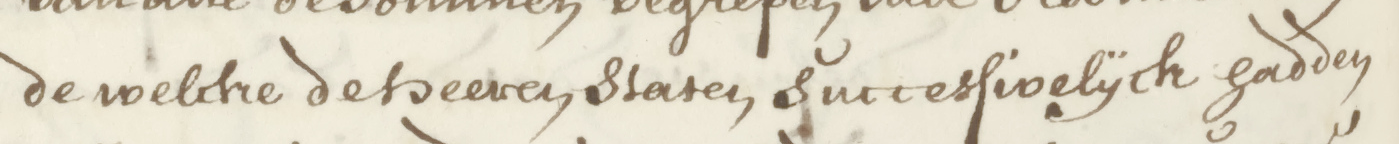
de welcke de heeren Staten, successivelijck hadden
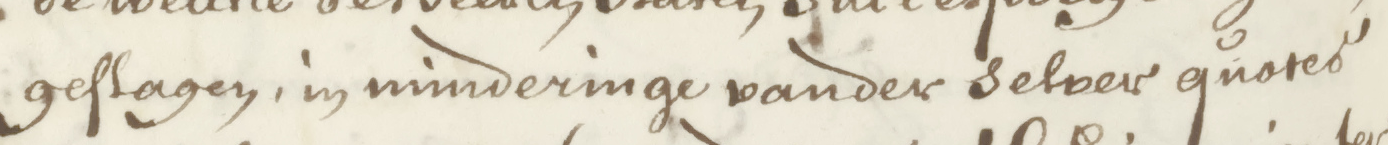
geslagen, in minderinge vander selver quotes
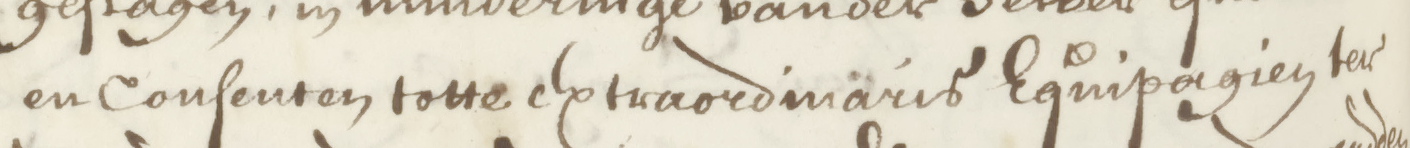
en consenten totte Extraordinaris Equipagien ter
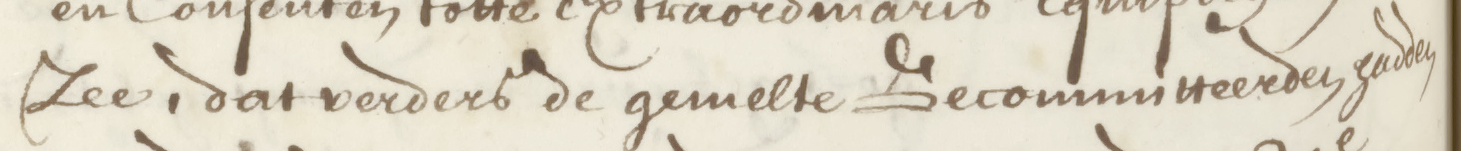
Zee, dat verders de gemelte Gecommitteerden hadden
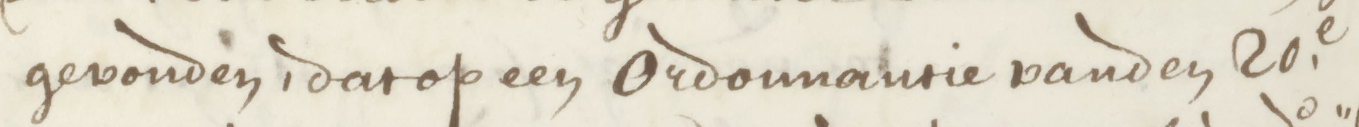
gevonden, dat op een Ordonnantie vanden 20e.
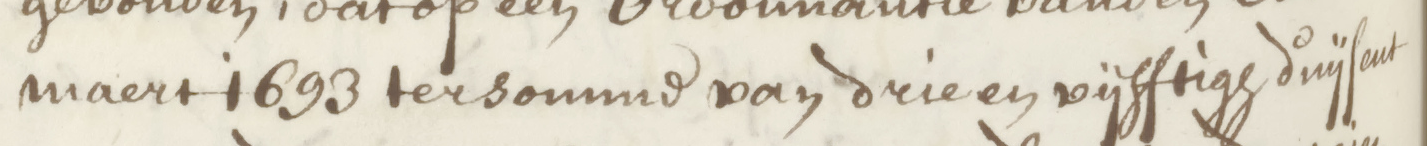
maert 1693 ter somme van drie en vijfftigh duijsent
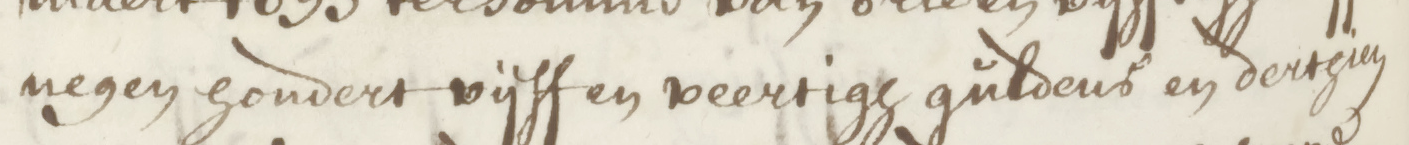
negen hondert vijffen veertigh guldens en derthien
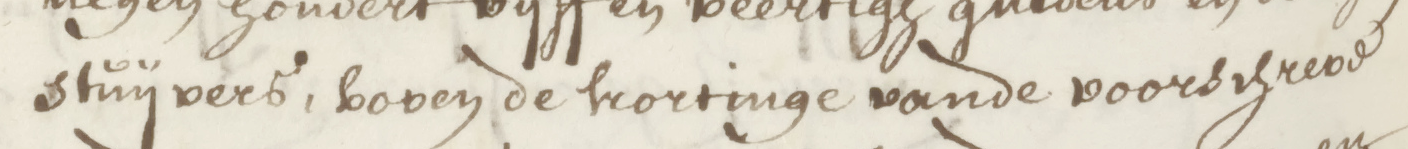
stuijvers, boven de kortinge vande voorschreve
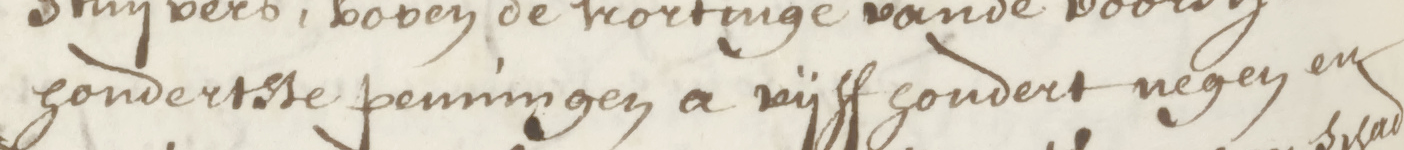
hondertste penningen a vijffhondert negen en
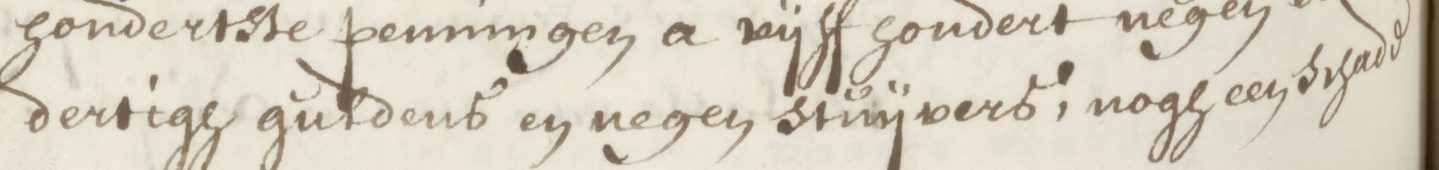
dertigh guldens en negen stuijvers, nogh een schade
